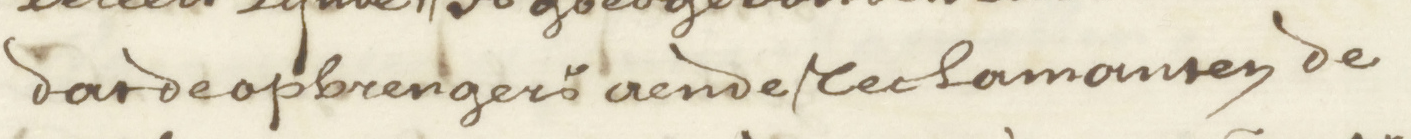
dat de opbrengers aende reclamanten de
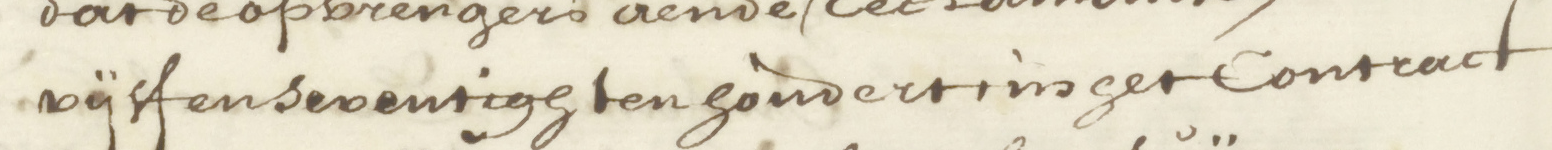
vijffenseventigh ten hondert, in het Contract
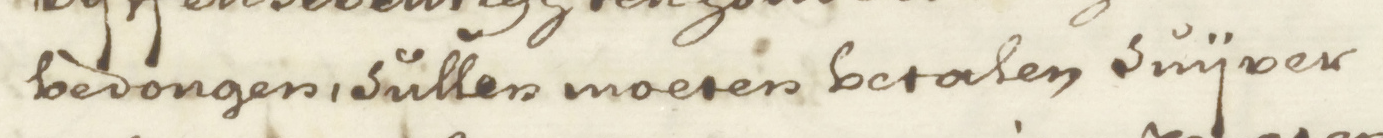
bedongen, sullen moeten betalen suijver
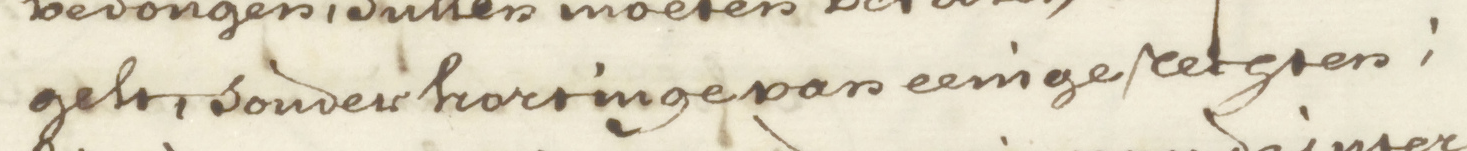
gelt, sonder kortinge van eenige rechten;
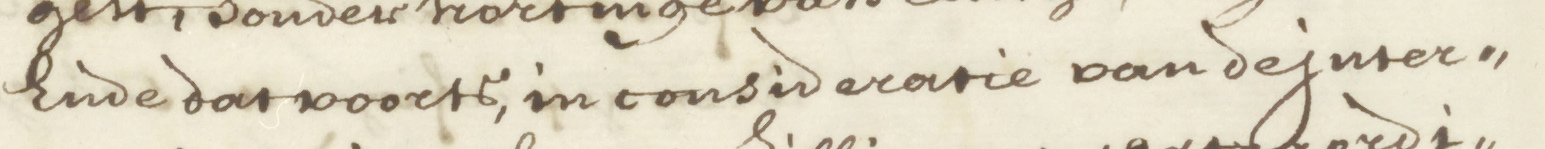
Ende dat voorts in consideratie van de inter„
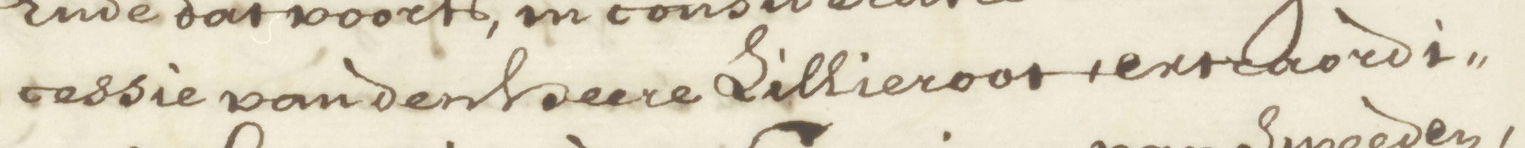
cessie vanden heere Lillieroot, extraordi„
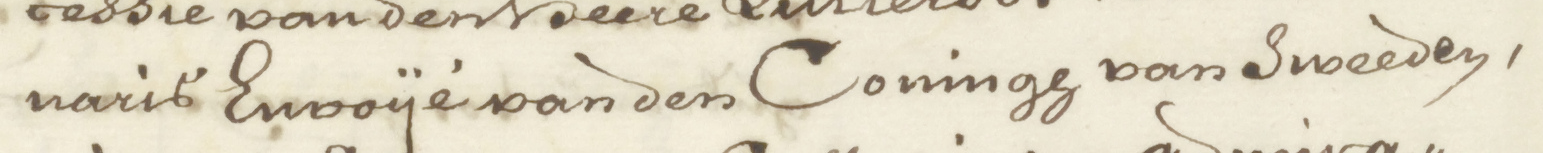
naris Envoijé van den Coningh van Sweeden,
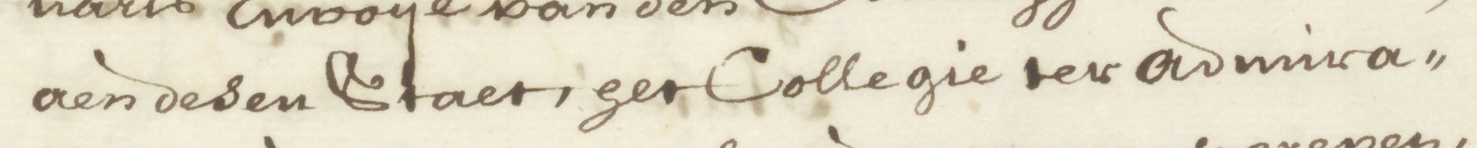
aen desen Staet, het Collegie ter Admira„
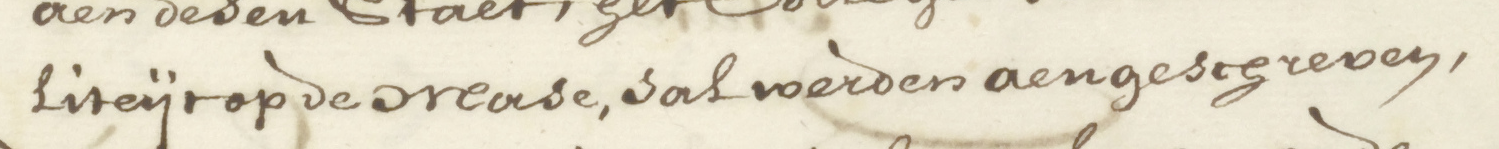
liteijt opde Mase, sal werden aengeschreven,
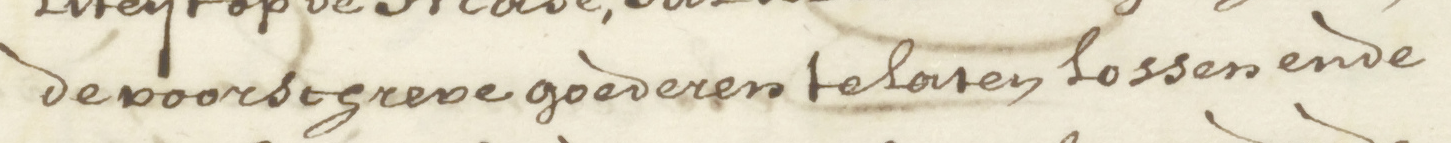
de voorschreve goederen te laten lossen ende
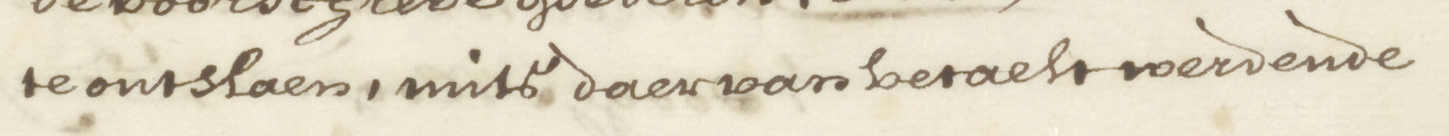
te ontslaen, mits daer van betaelt werdende
